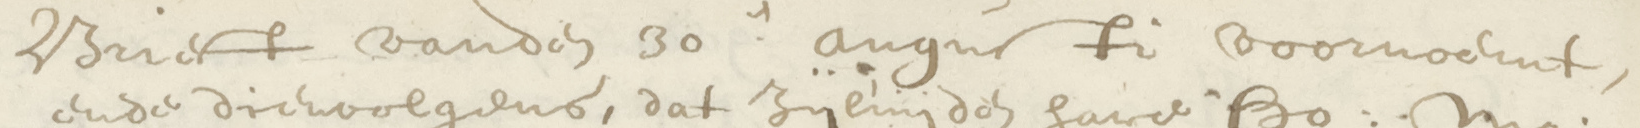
Brieff vanden 30e augusti voornoemt,
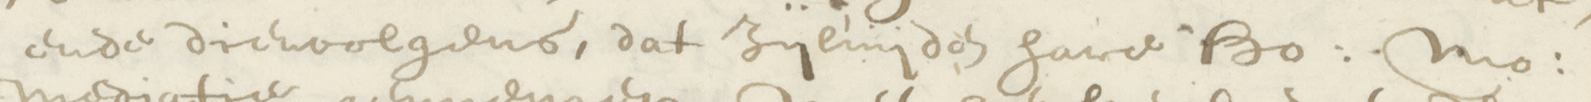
ende dienvolgens, dat zijluijden hare Ho:Mo:
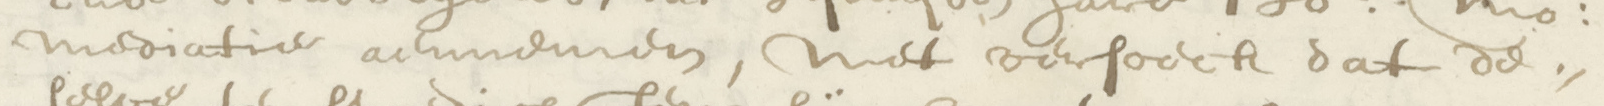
mediatie aennemen, met versoeck dat de„
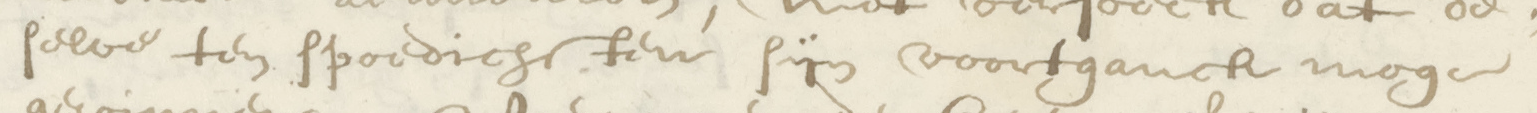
selve ten spoedichsten sijn voortganck moge
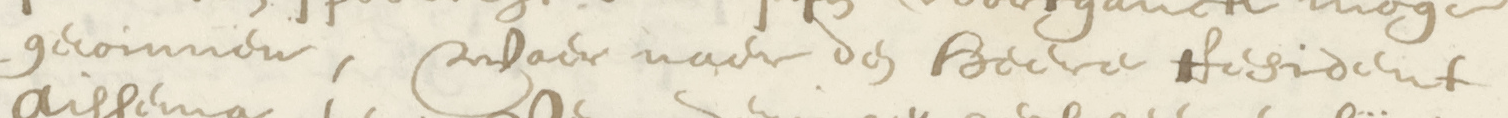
gewinnen. Waer naer den heere Resident
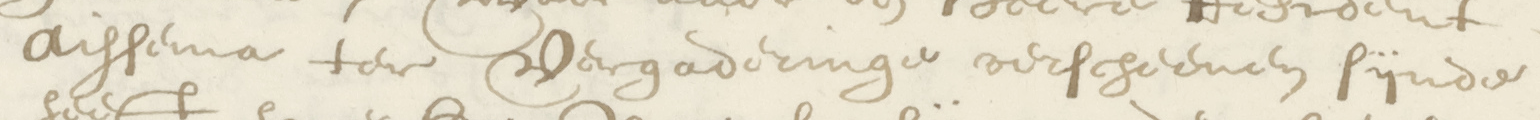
Aissema ter Vergaderinge verscheenen sijnde,
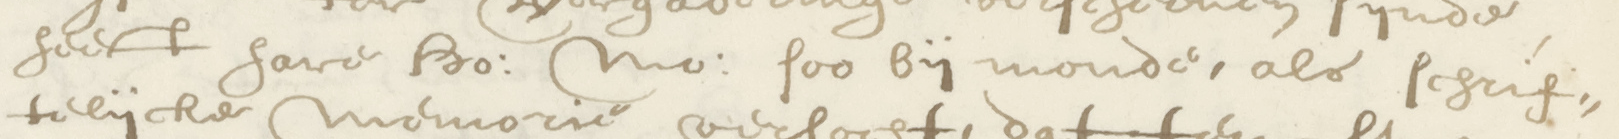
heeft hare Ho: Mo: soo bij monde, als schrif„
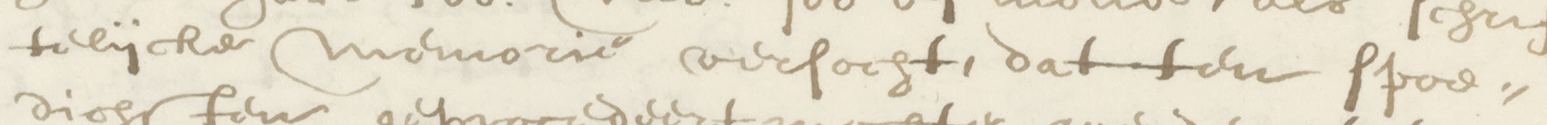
telijcke memorie versocht, dat ten spoe„
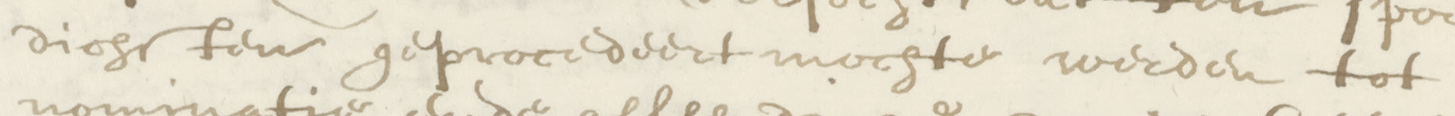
dichsten geprocedeert mochte werden tot
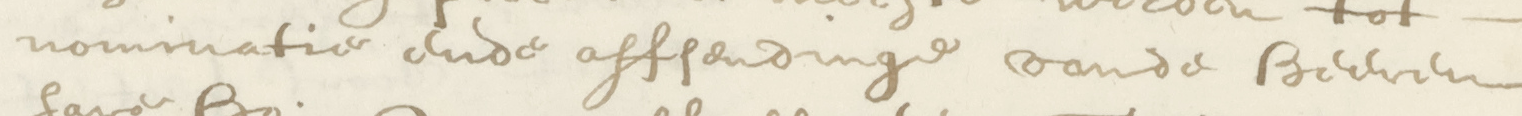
nominatie ende affsendinge van de Heeren
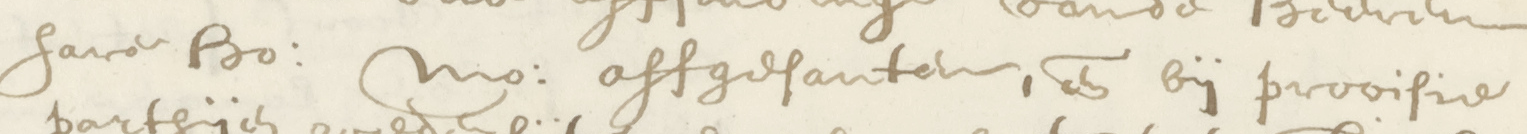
hare Ho:Mo: affgesanten, en bij provisie
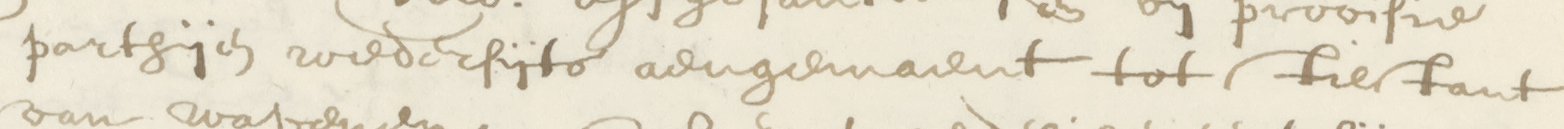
parthijen wedersijts aengemaent tot stilstant
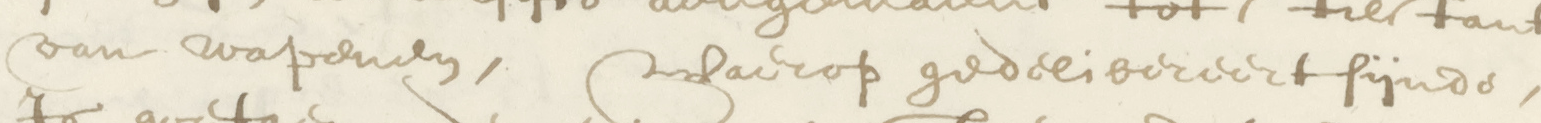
van wapenen. Waerop gedelibereert sijnde,
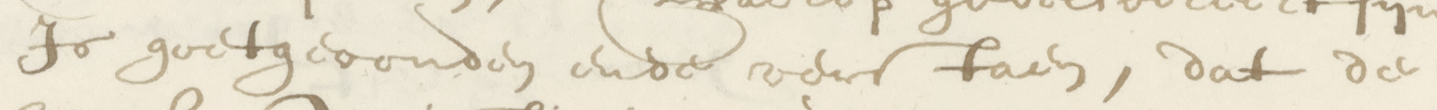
is goetgevonden ende verstaen, dat de
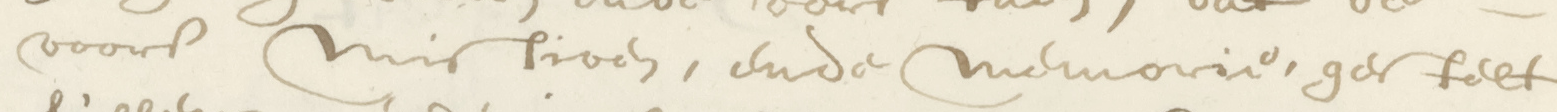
voors missive, ende memorie, gestelt
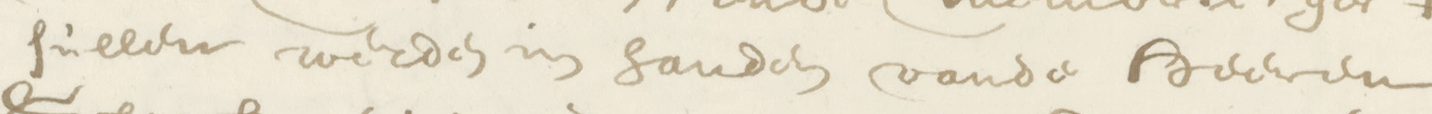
sullen werden in handen vande Heeren
